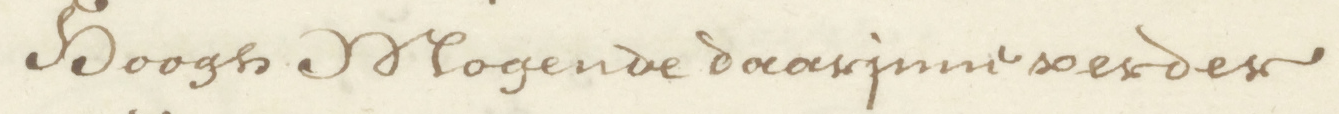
Hoogh Mogende daarinne verder
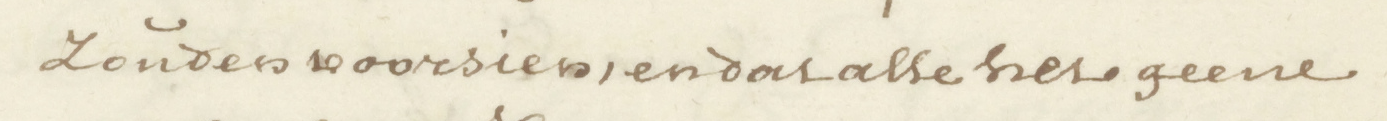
zouden voorsien, en dat alle het geene
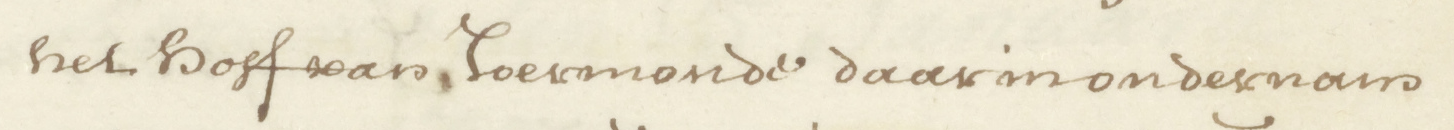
het Hoff van Roermonde daarin ondernam
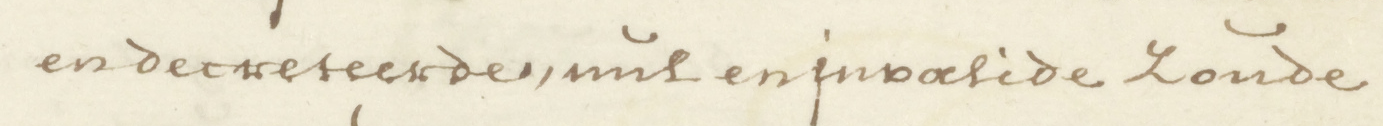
en decreteerde, nul en invalide zoude
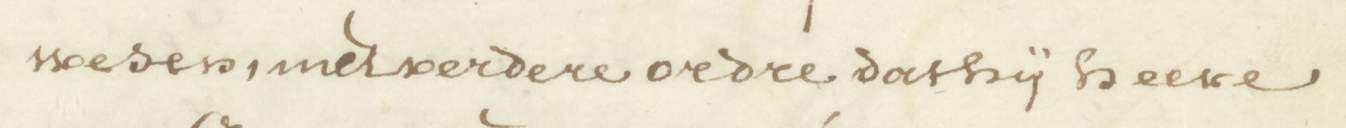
wesen, met verdere ordre dat hij heere
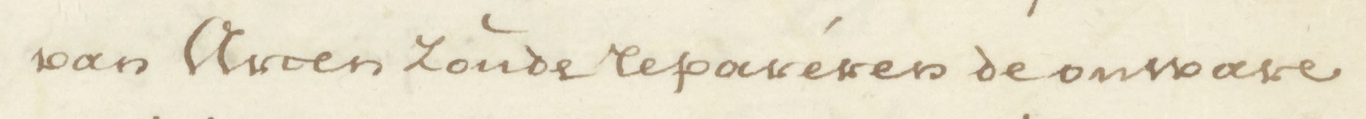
van Arcen zoude repareren de onware
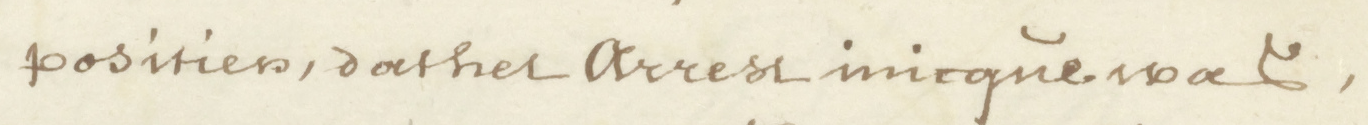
positien, dat het Arrest inicque was,
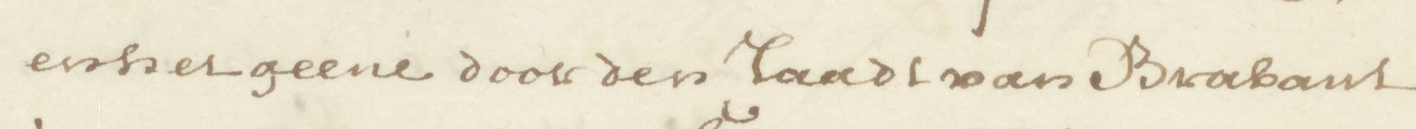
en het geene door den Raadt van Brabant
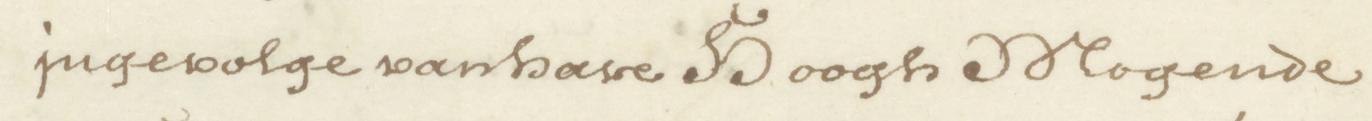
ingevolge van hare Hoogh Mogende
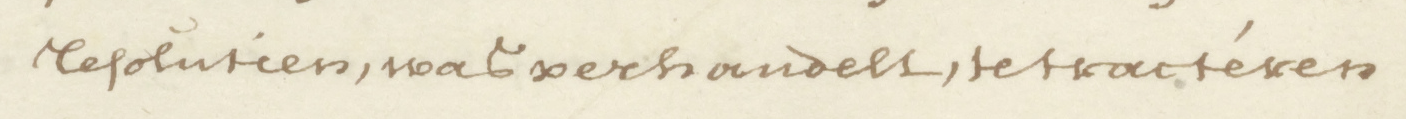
resolutien, was verhandelt, te tracteren
